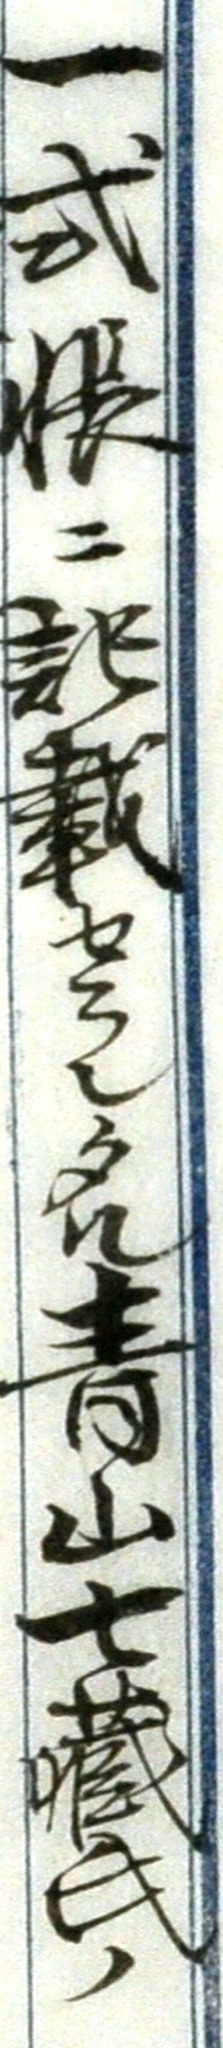一式帳ニ記載セラレタル青山七蔵氏ノ
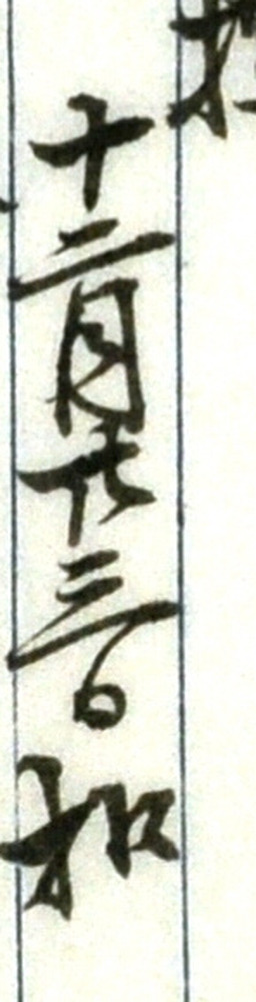十二月廿三日扣
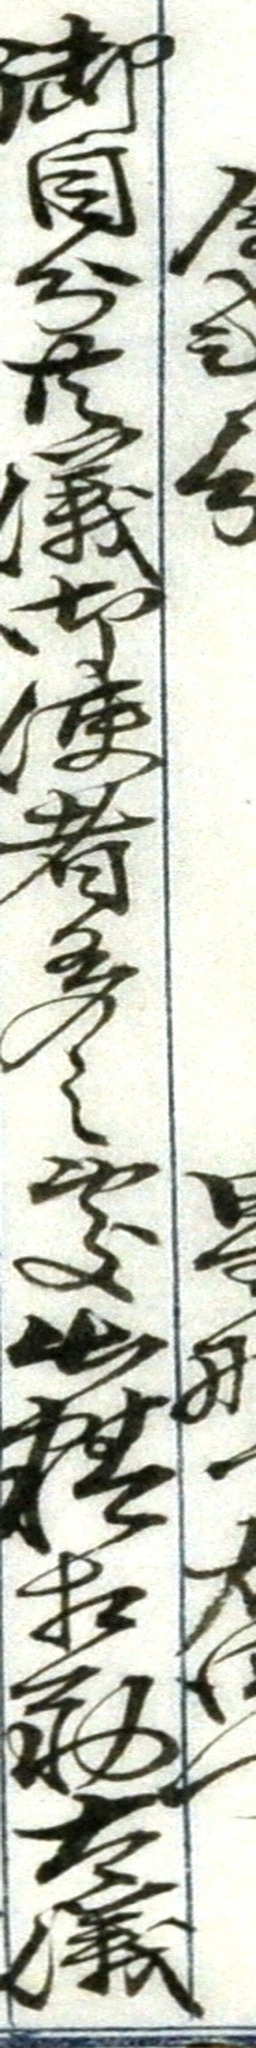御自分共儀御使者多之處出精相勤太儀
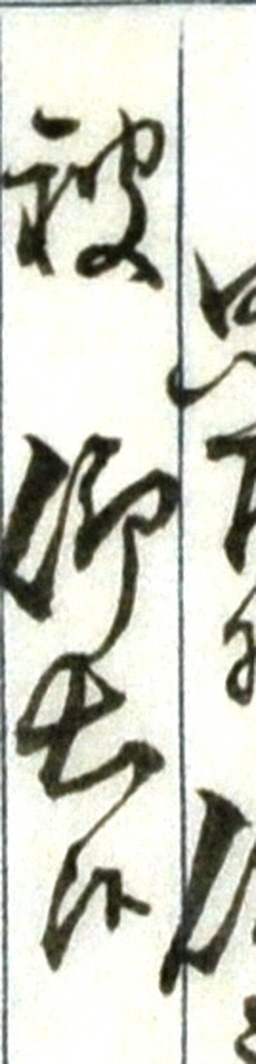被仰出候
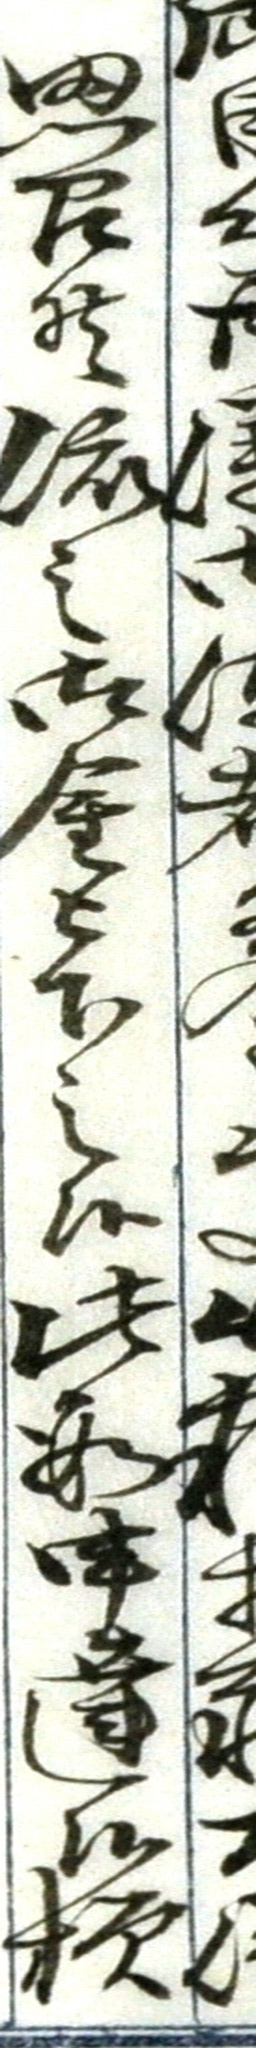思召候依之御金被下之候此如申達候様
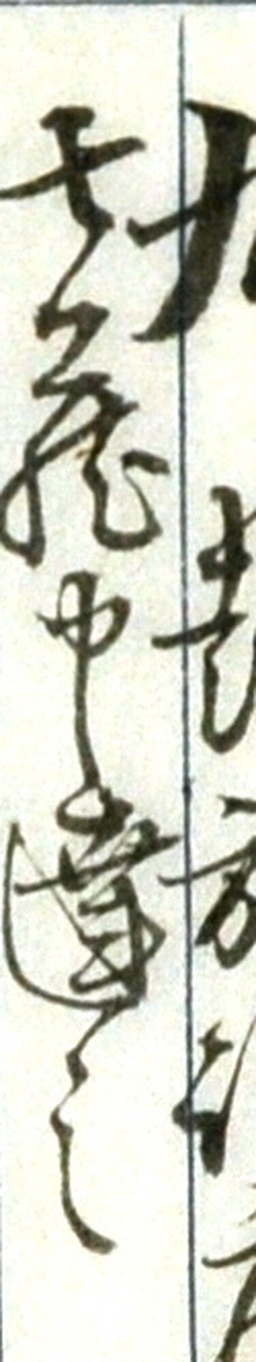七藏申達之
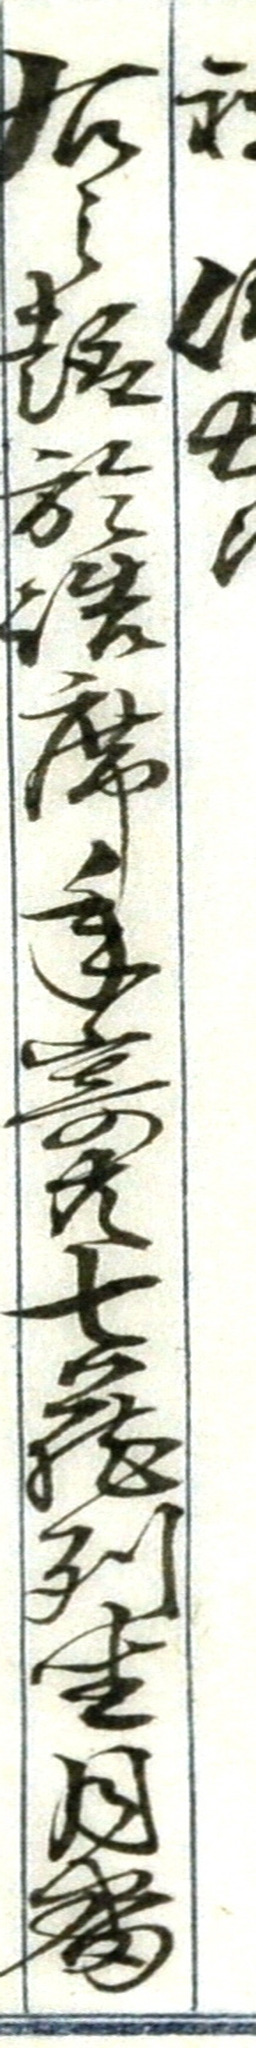右之趣於詰席年寄共七藏列座月番
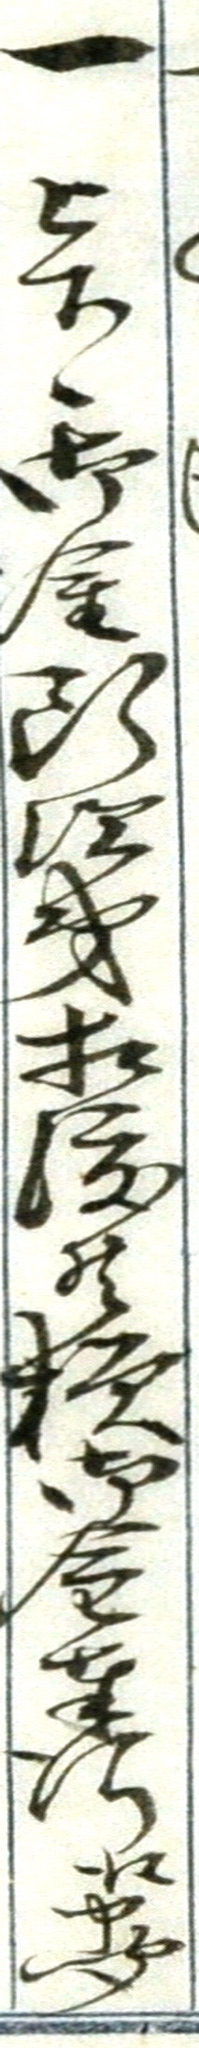一被下候御金断次第相渡候様御金奉行江申聞
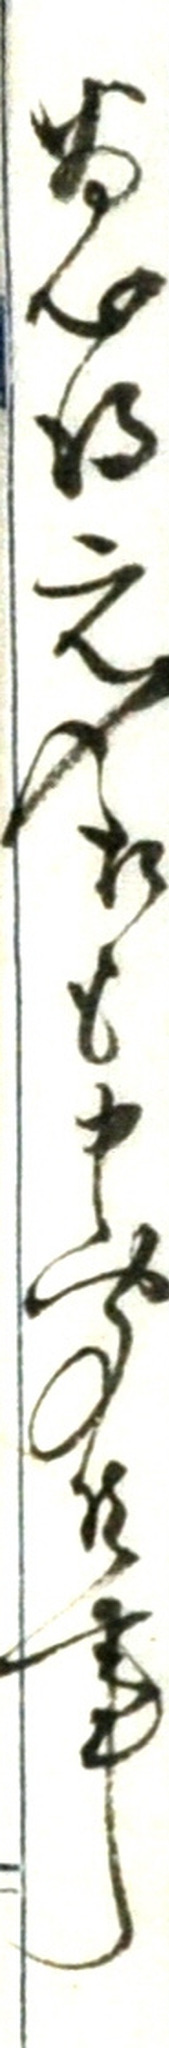尚心得元江も申聞候事

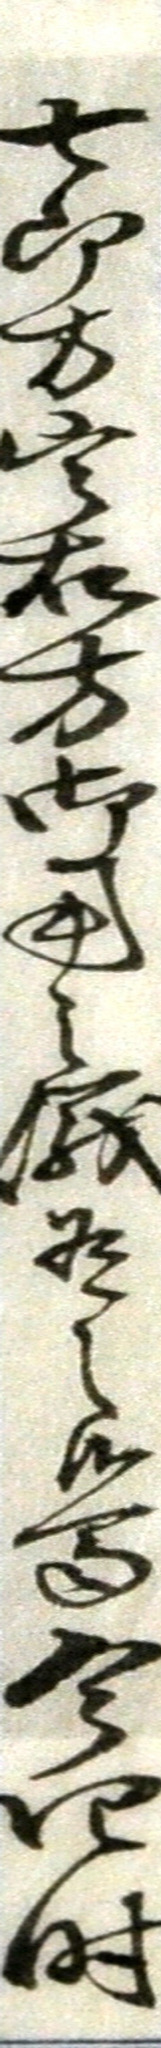一七郎方宇右方御用之儀有之候間今四時
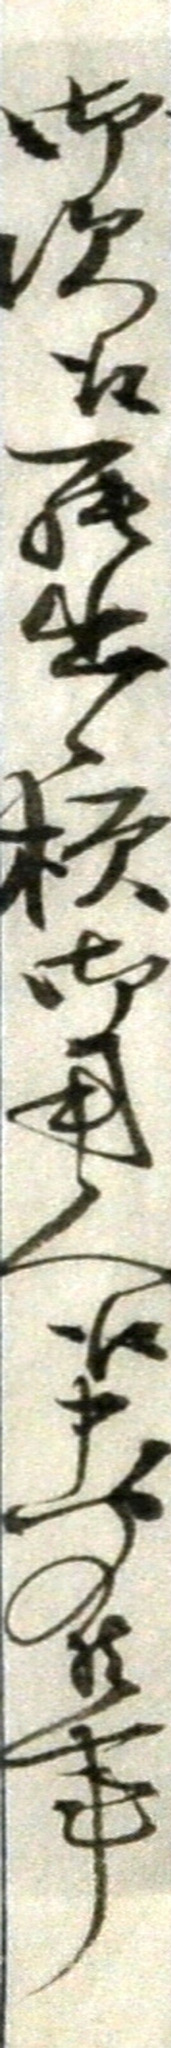御次江罷出候様御用人江申聞候事
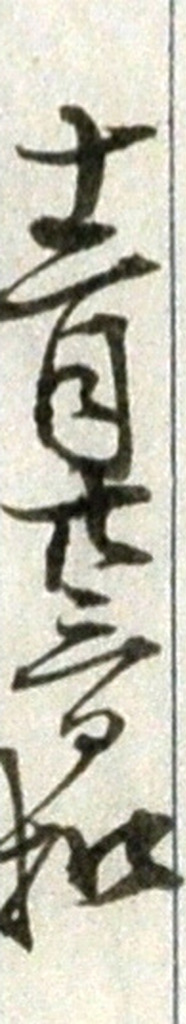十二月廿三日扣
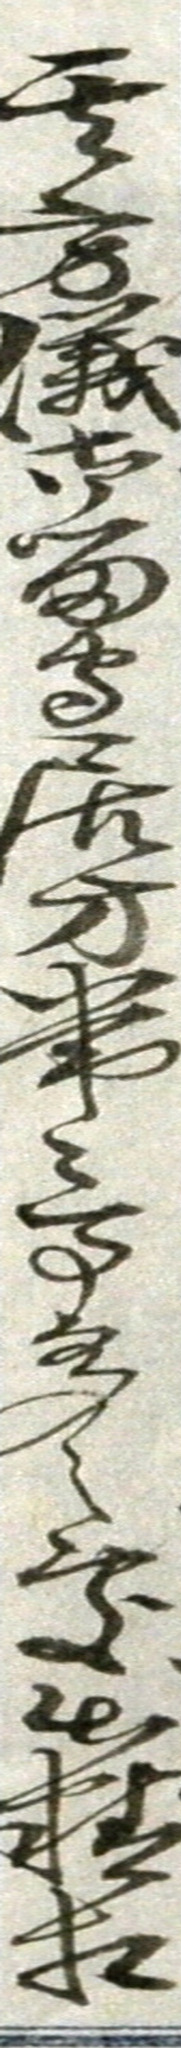其方儀御留守居方常ニ事多之處出精相
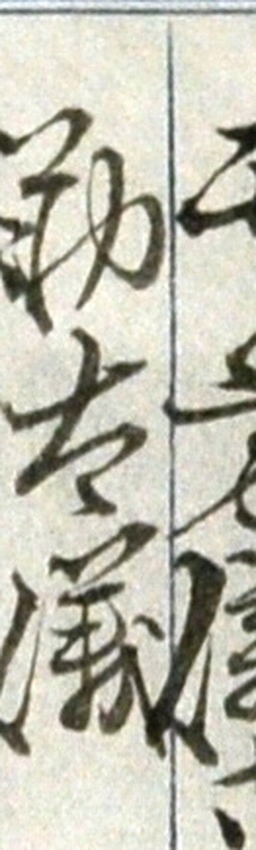勤太儀
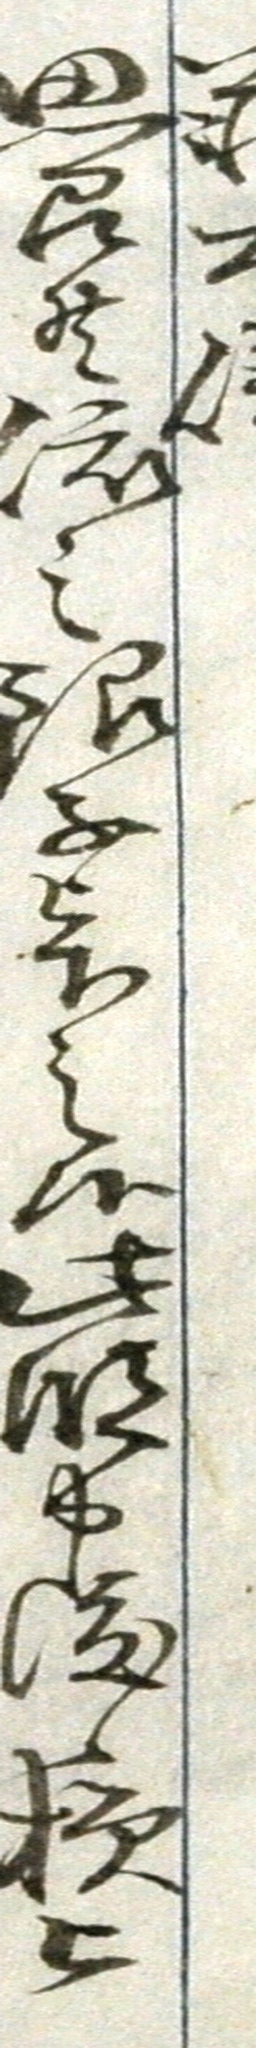思召候依之銀子被下之候此段申渡候様被
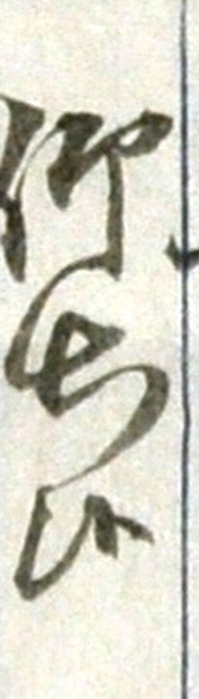仰出候
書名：上方ヨリ御帰府之後江戸勤并江戸在番中之者江被下・控
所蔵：伊那市立高遠町図書館・合同会社AMANE
